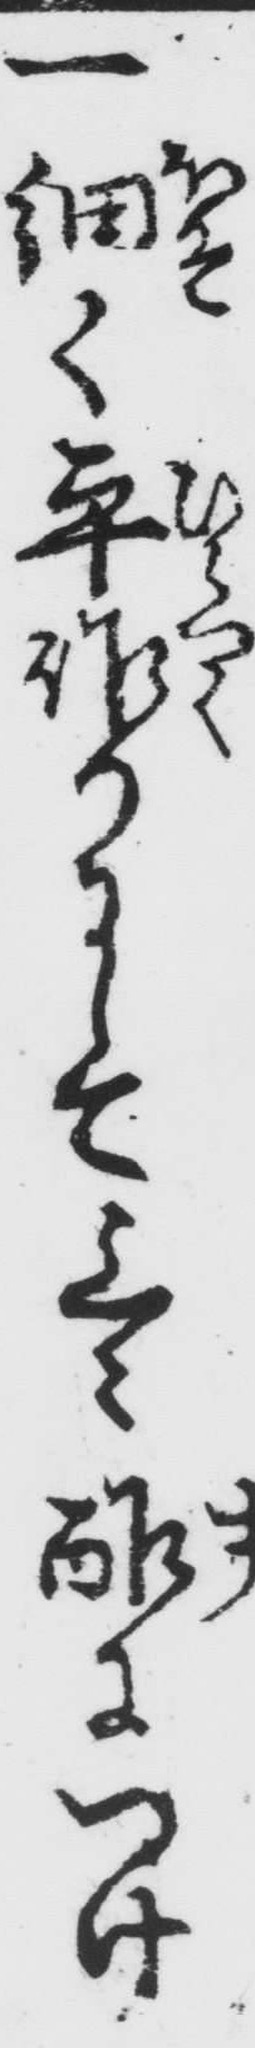一細く平作りにして上々酢につけ
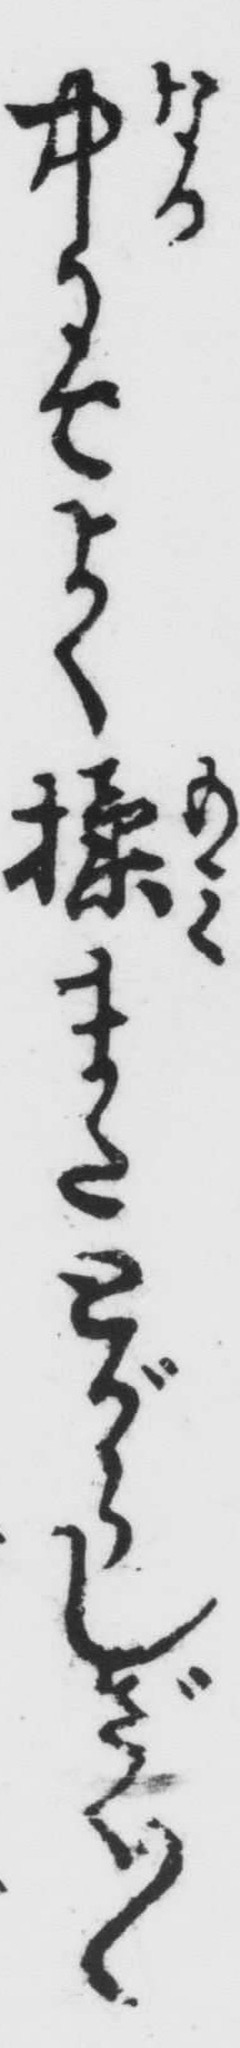中にてよく揉またとがらしざく〳〵
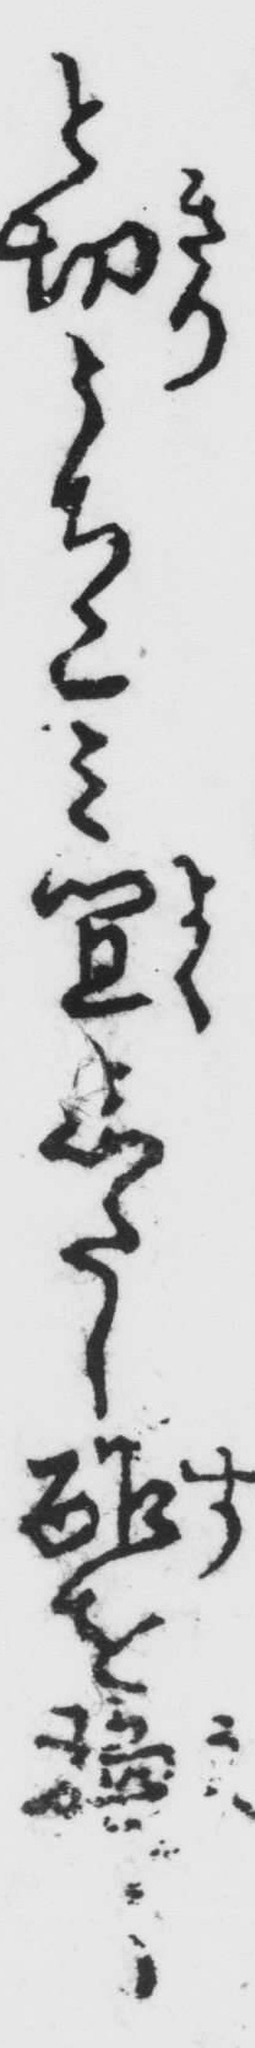と切うちこみ宜したし酢を換
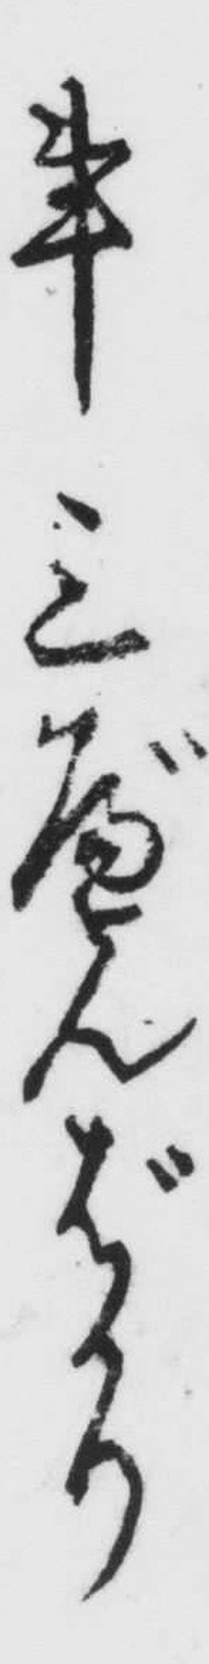事三べんばかり
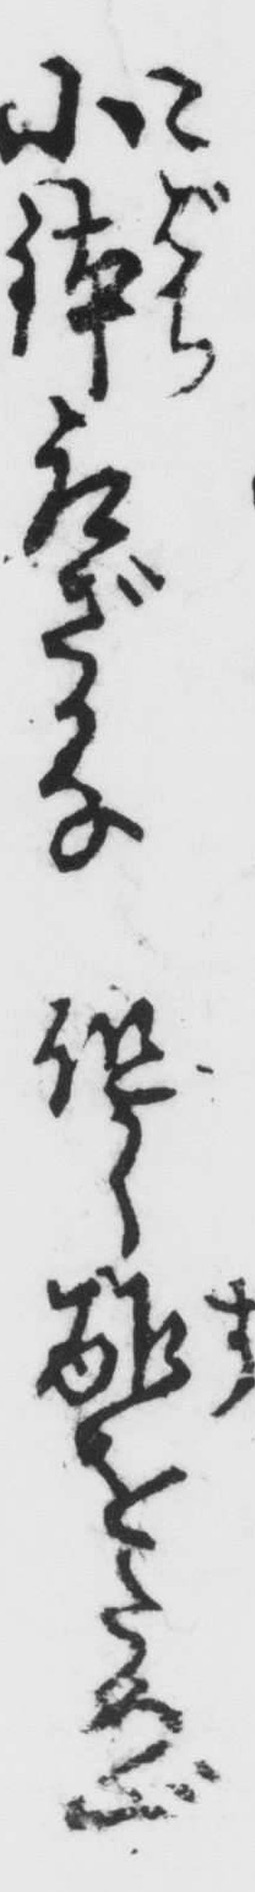小鉢取ざかな但し酢をためず

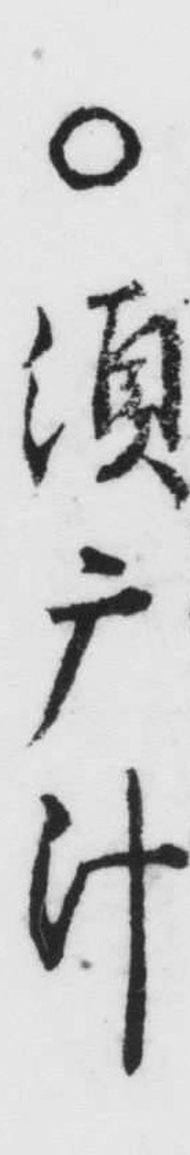○須磨汁
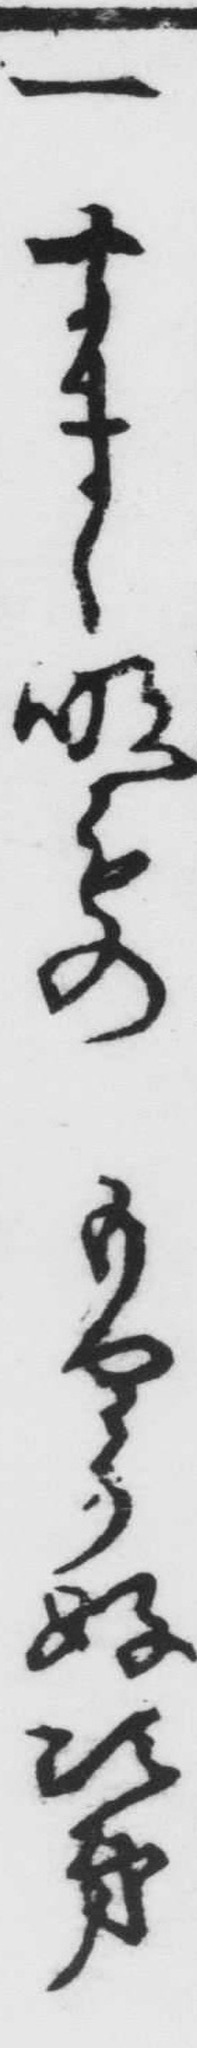一すまし吸ものもやう好次第
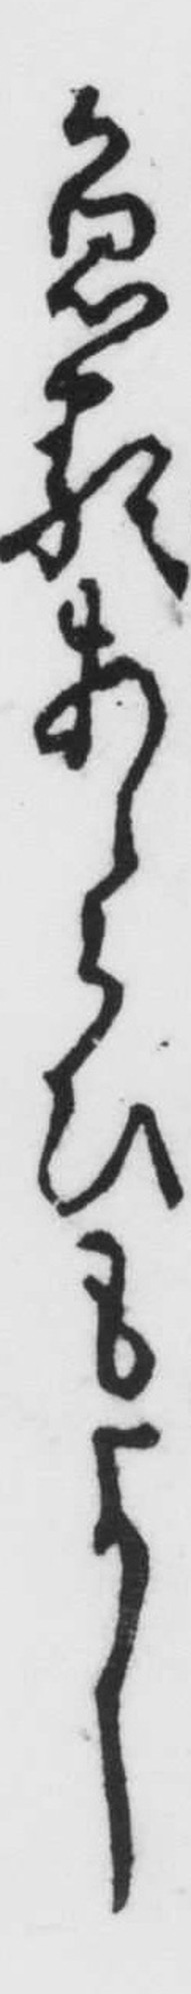魚類あしらひもよし
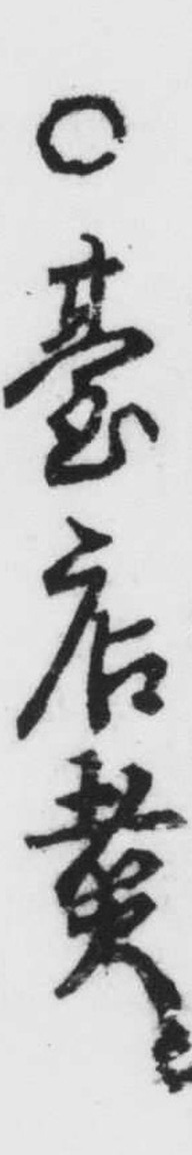○台店煮
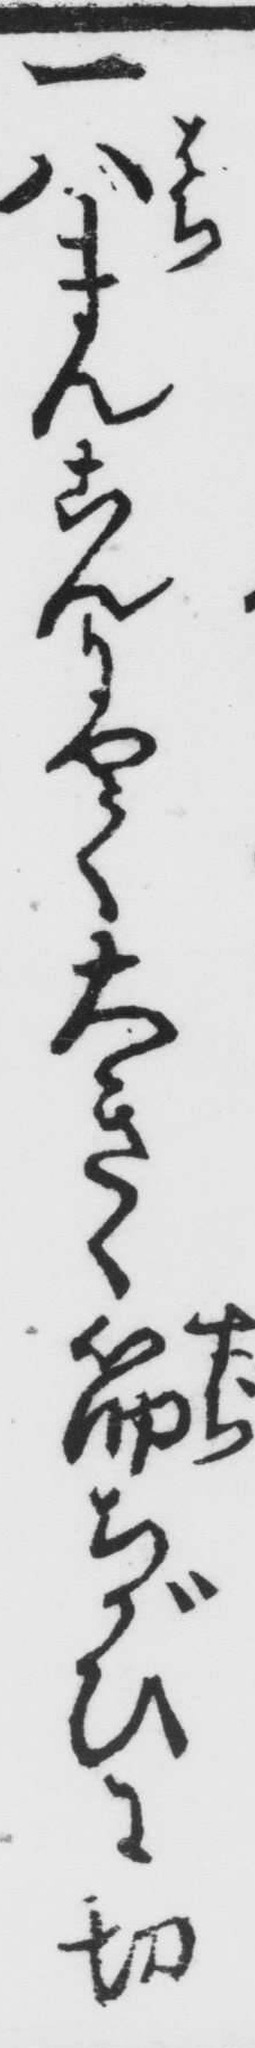一八まんこんにやく大きく筋ちがひに切
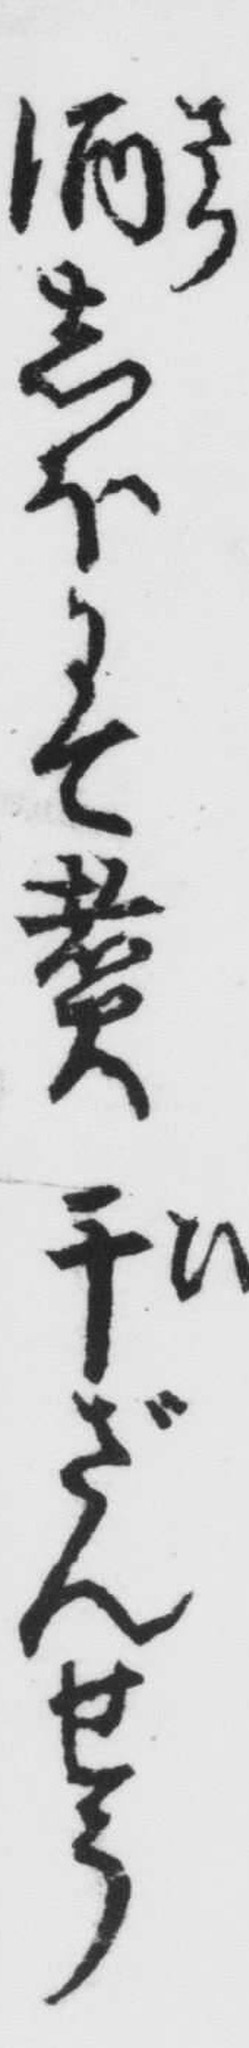酒しほにて煮干ざんせう
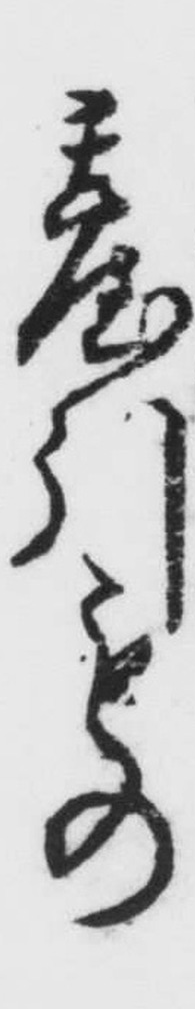台引もの
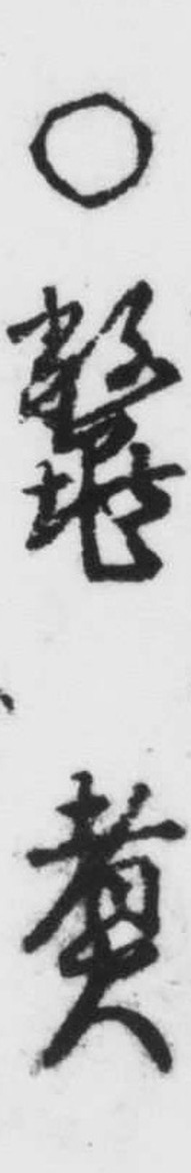○鼈煮
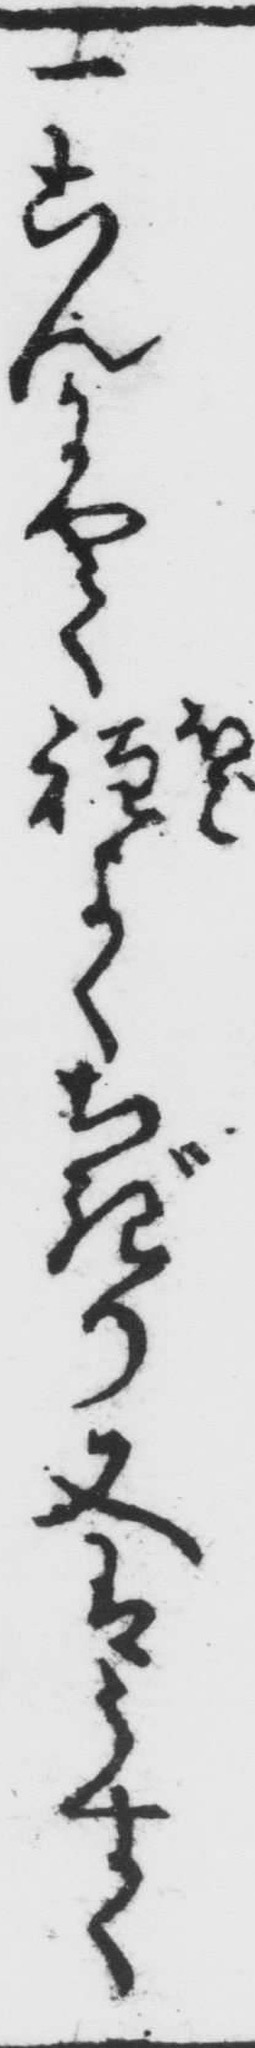一こんにやく程よくちぎり又はうすく
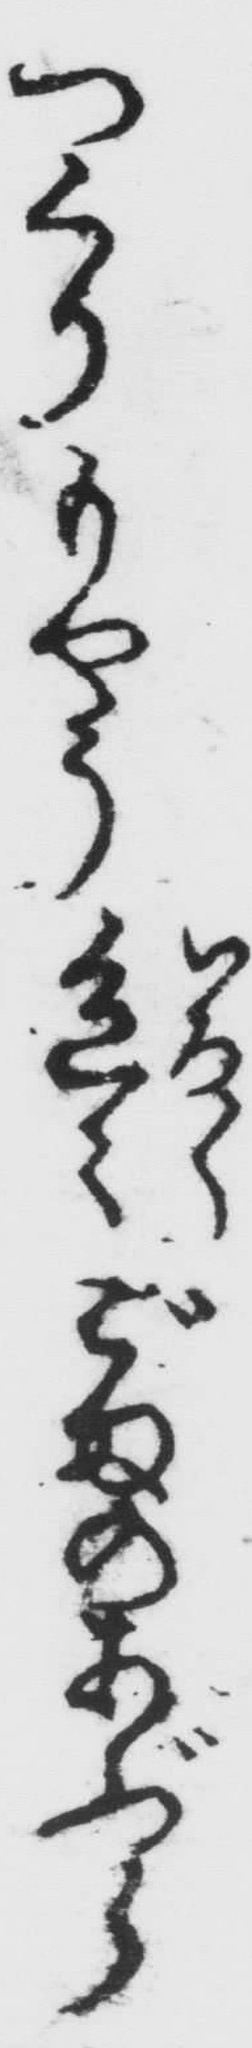つくりもやう色々ごまのあぶら
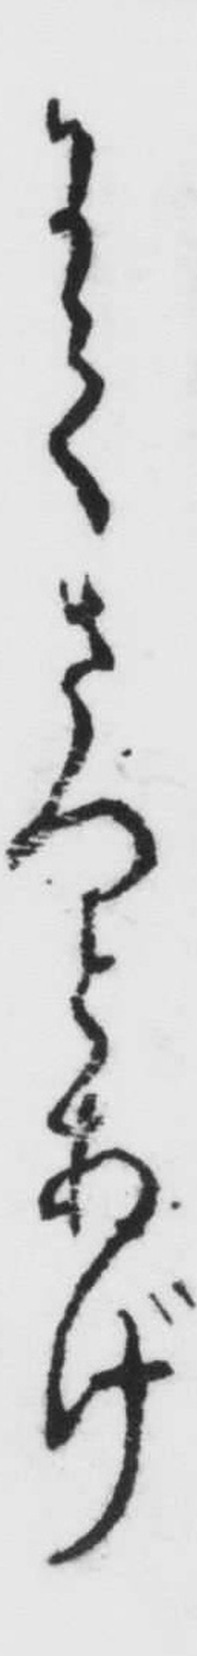にてさつとあげ
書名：蒟蒻百珍
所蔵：大阪府立大学学術情報センター 国文学研究資料館
